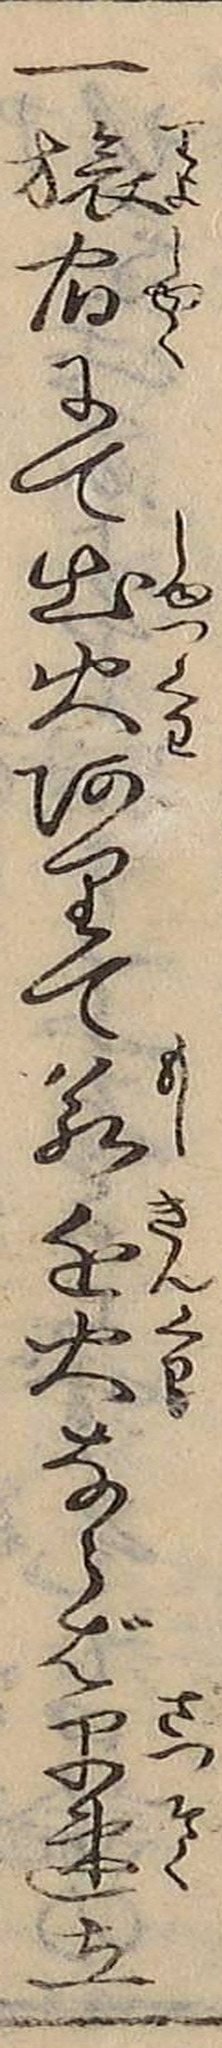一旅宿にて出火ありて若近火ならば早速立
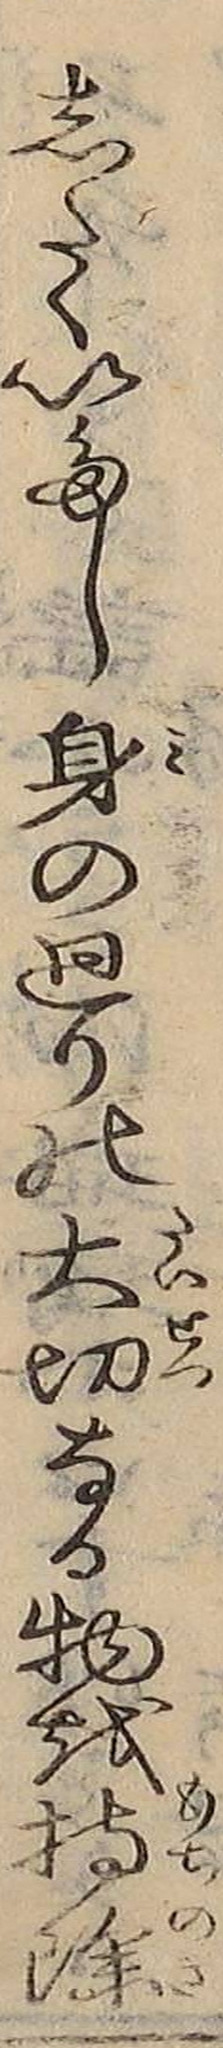したくいたし身の廻りの大切なる物を持除
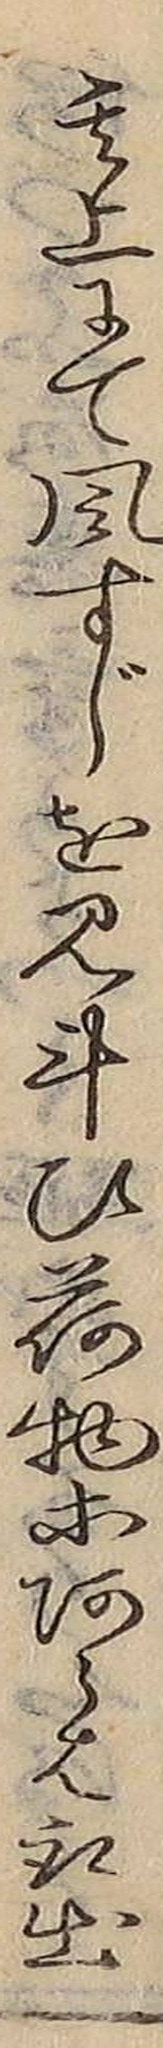其上にて風すじを見計ひ荷物等あらは取出
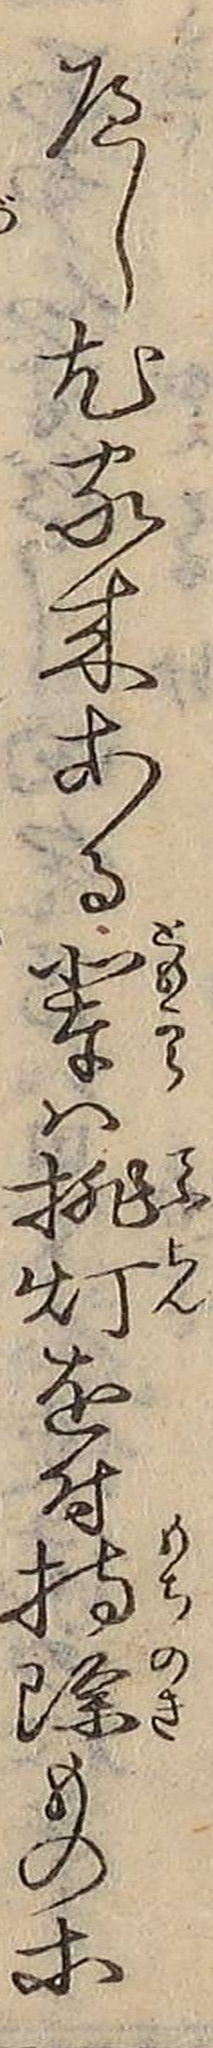へし尤家来ある輩は挑灯を付持除もの等
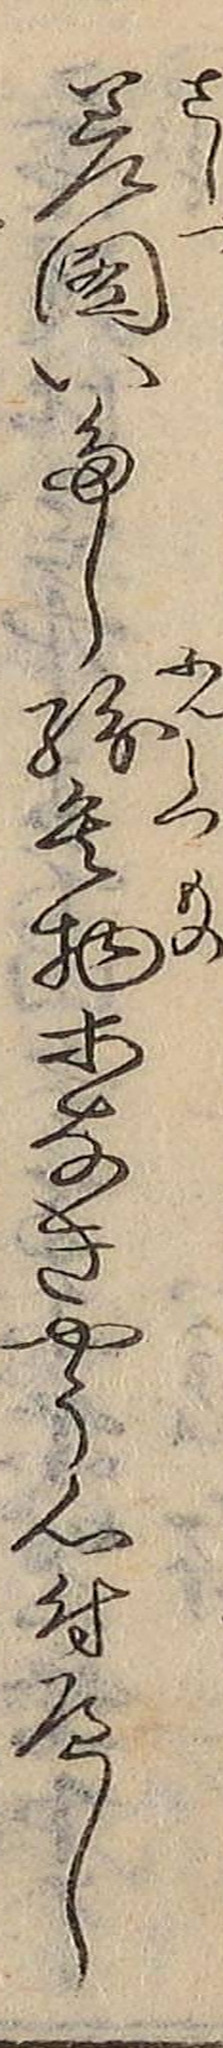差図いたし紛失物等なきやう心付へし
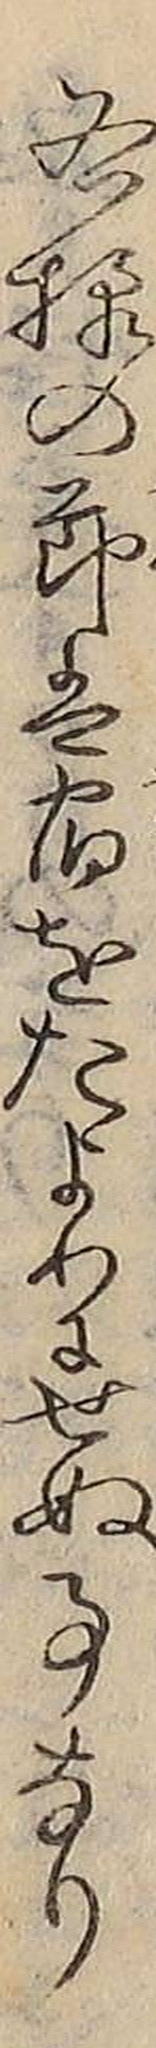右様の節は宿をたよりにせぬ事なり
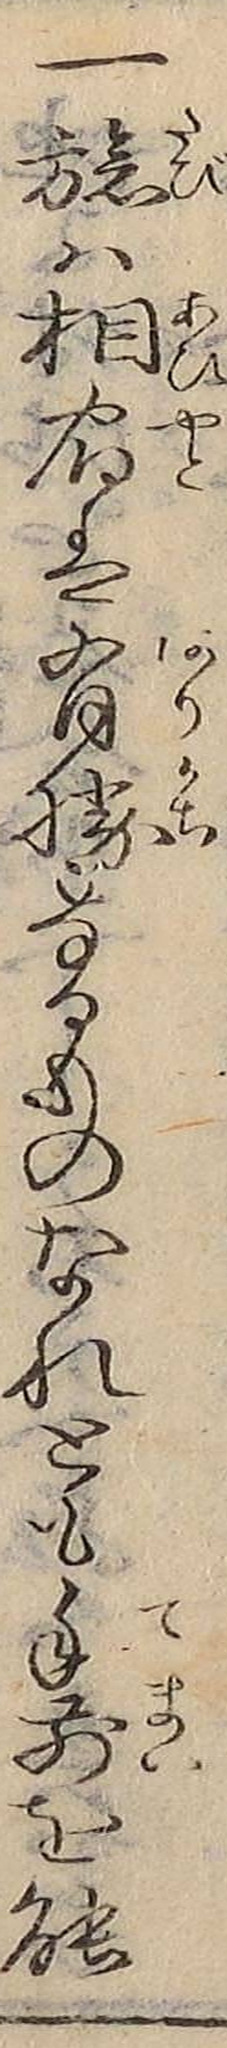一旅は相宿は有勝なるものなれとも手前を能
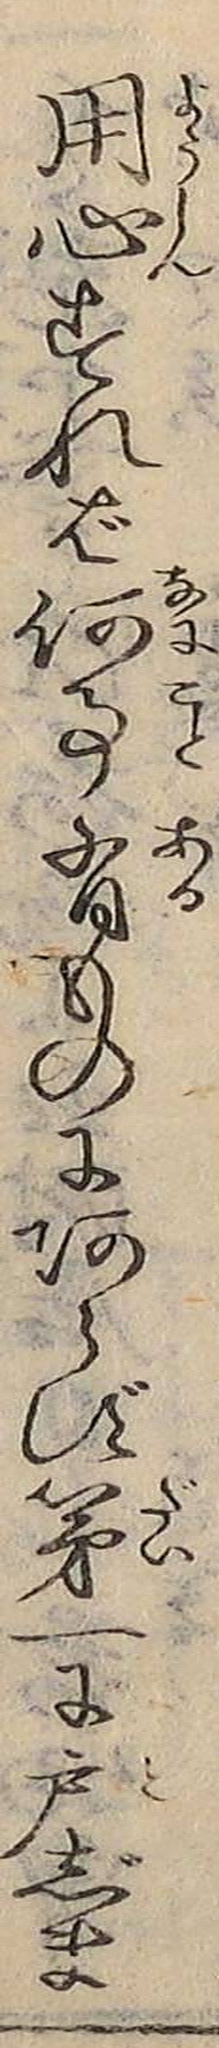用心すれば何事有ものにあらず第一に戸じま
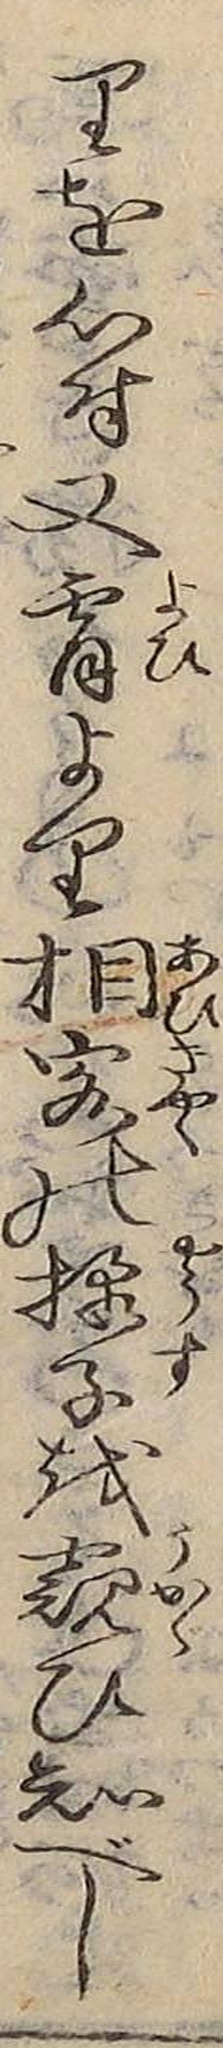りを心付又宵より相客の様子を窺ひ知べし
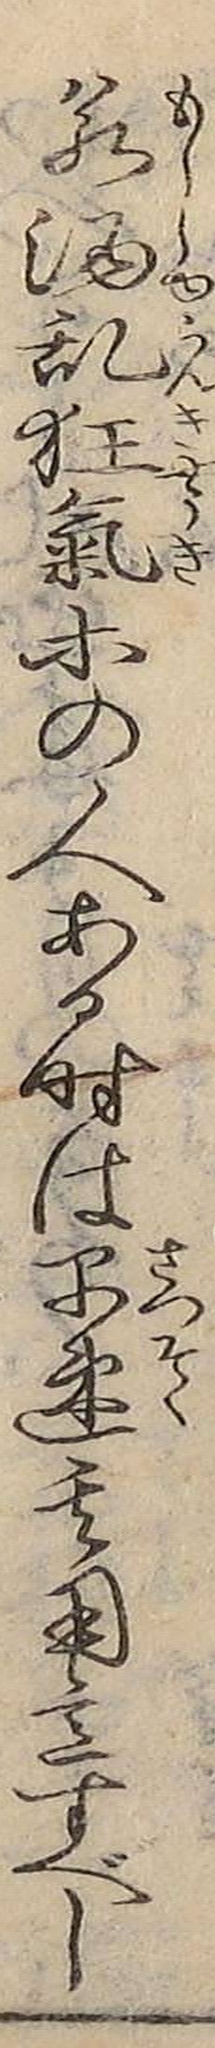若酒乱狂気等の人ある時は早速其用意すべし
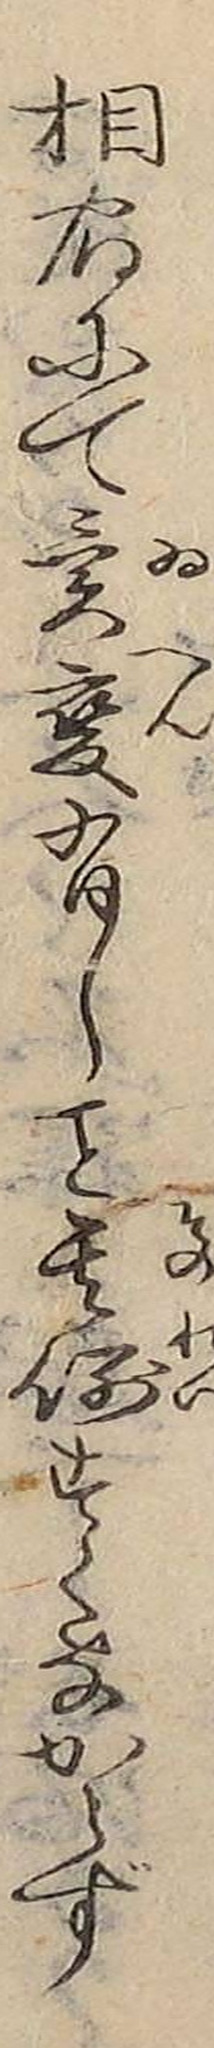相宿にて異変有しこと其例すくなからず
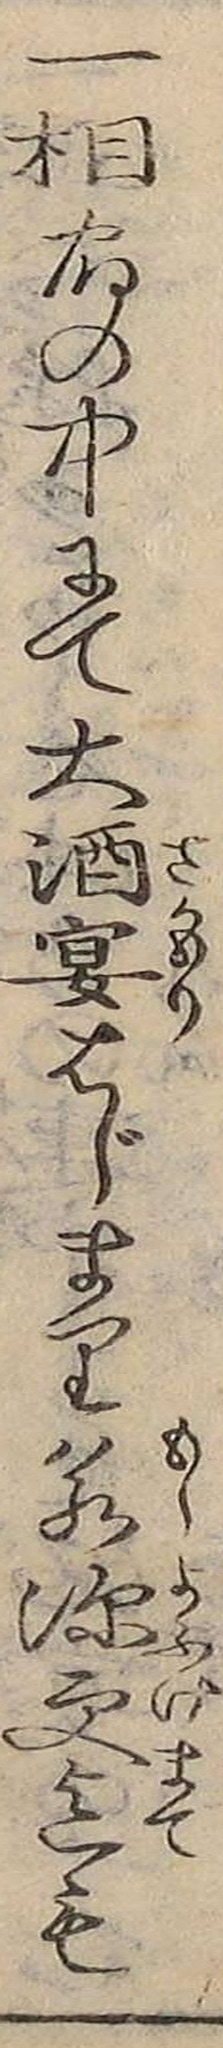一相宿の中にて大酒宴はじまり若深更迄も

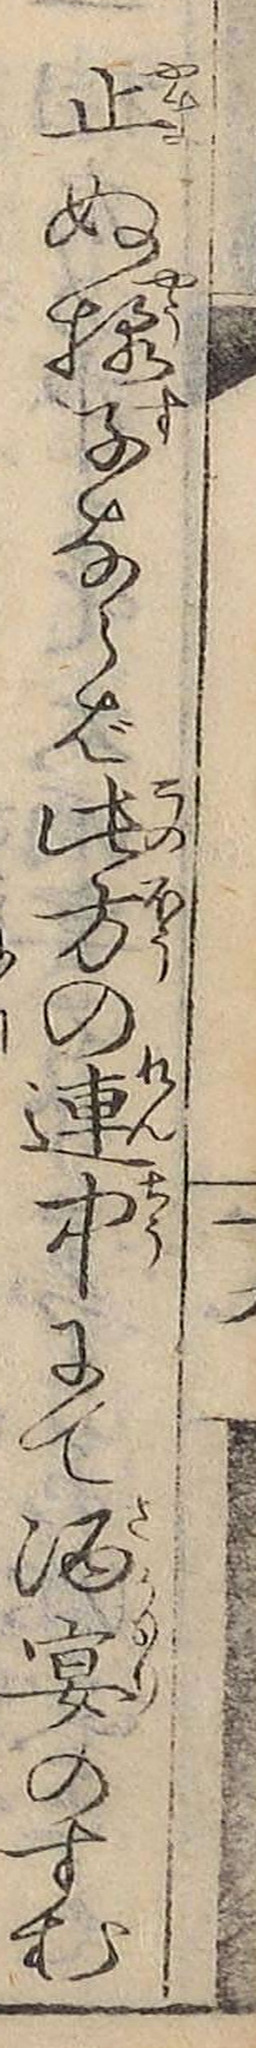止ぬ様子ならば此方の連中にて酒宴のすむ
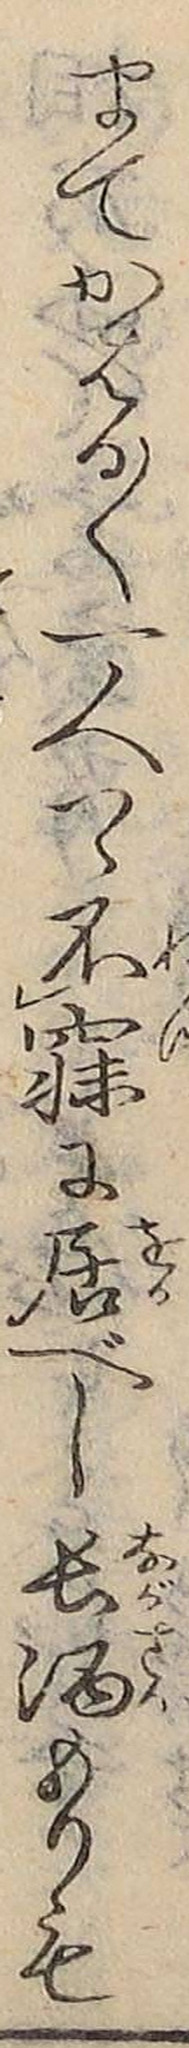まてかはる〳〵一人つゝ不寐に居べし長酒もりも
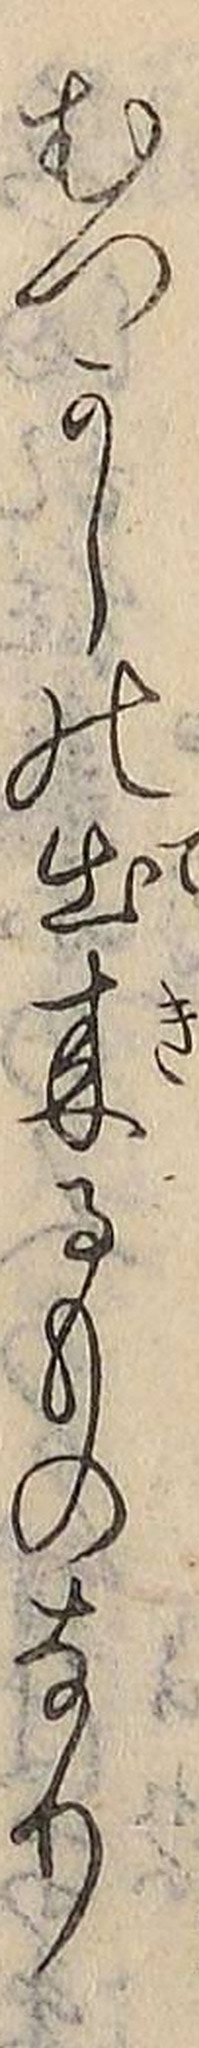むつかしの出来るものなりも
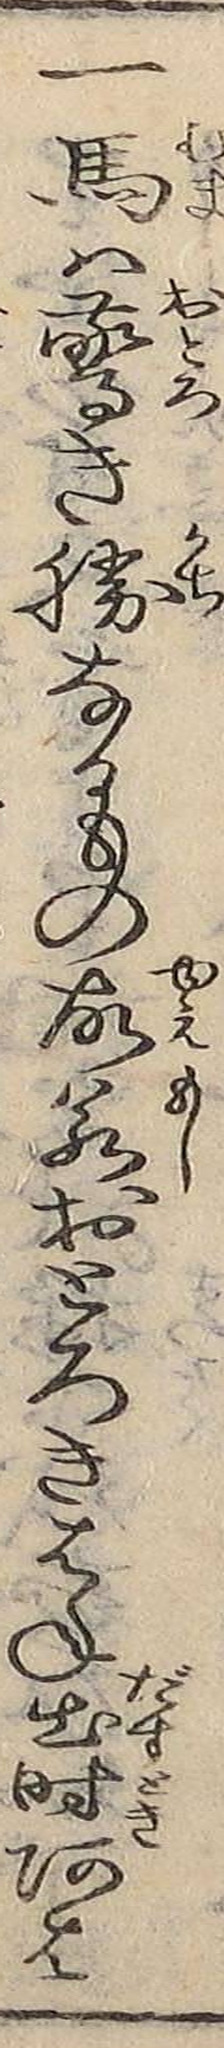一馬は驚き勝なるもの故若おとろきはね出時あは
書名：旅行用心集
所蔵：神戸大学附属図書館 国文学研究資料館
